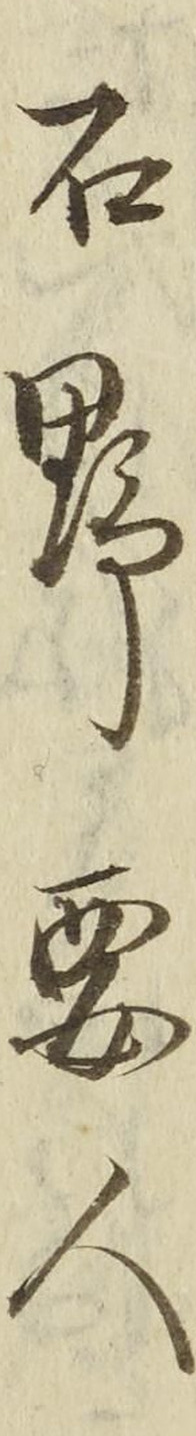石野要人
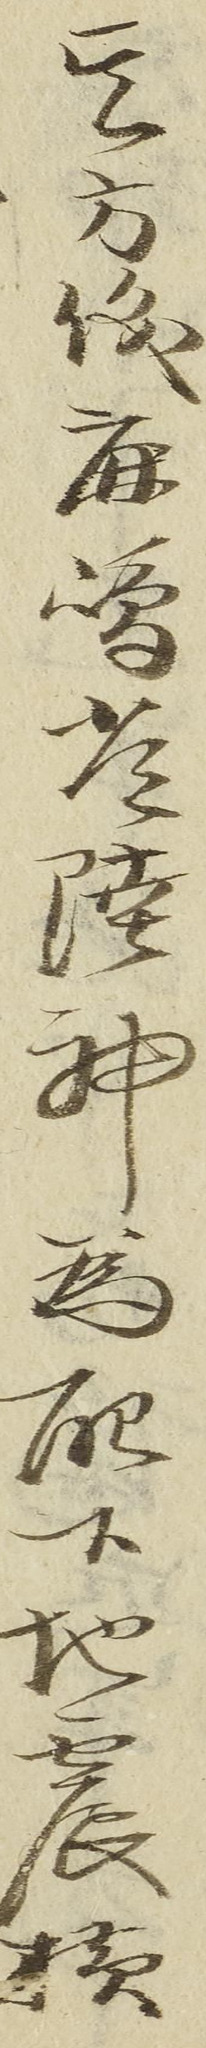其方儀鹿嶋常陸神為配下地震損
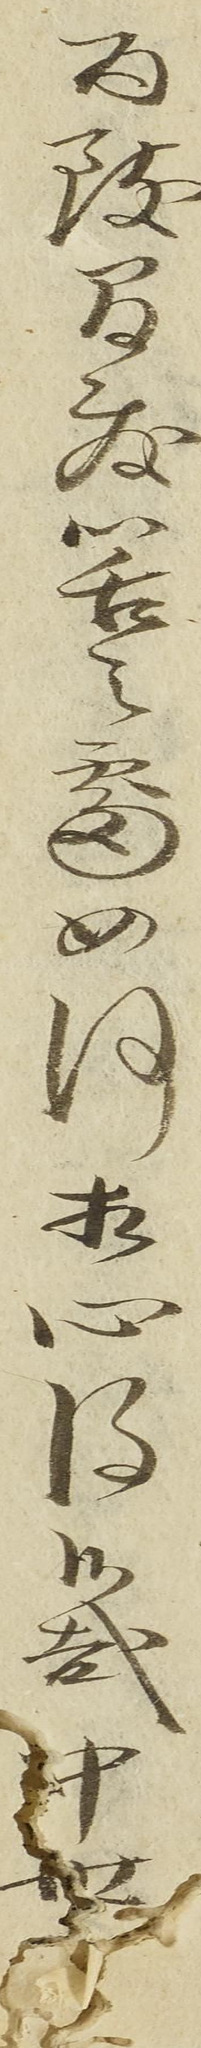為致間敷筈之処如何相心得候哉中世
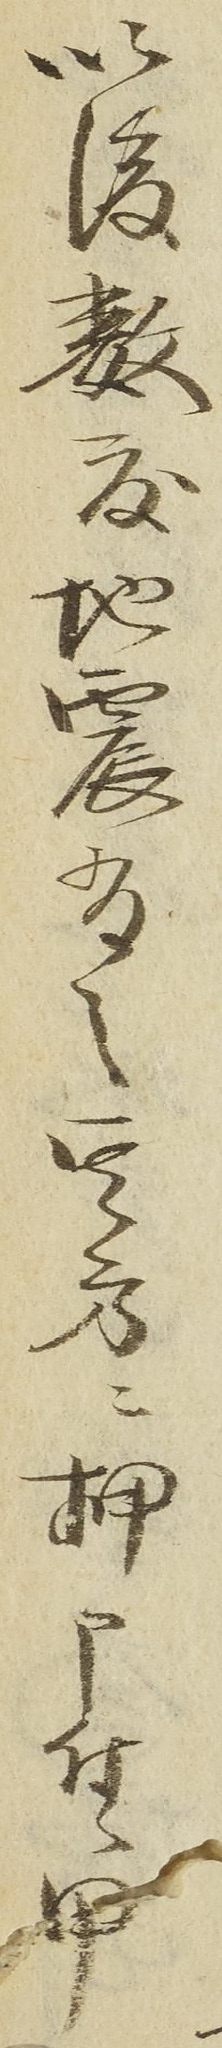以後数度地震有之其方二押申付候甲

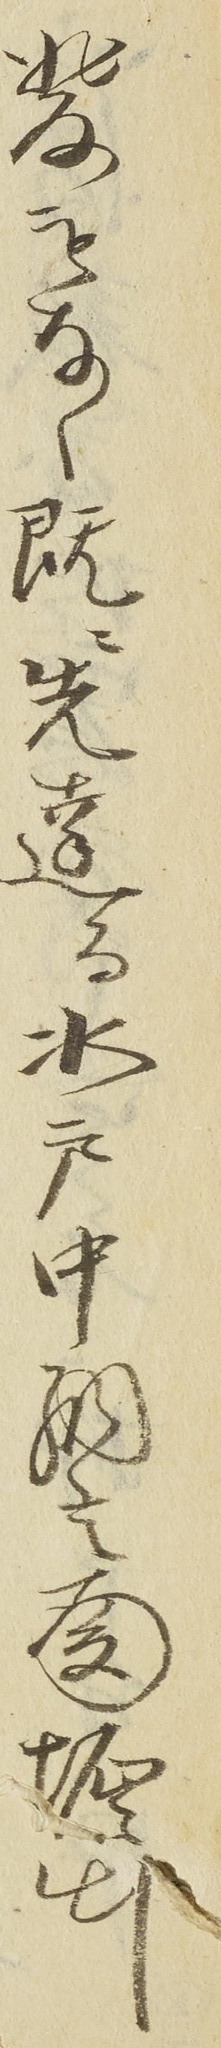斐も無之既二先達而水戸中納言殿堀出し
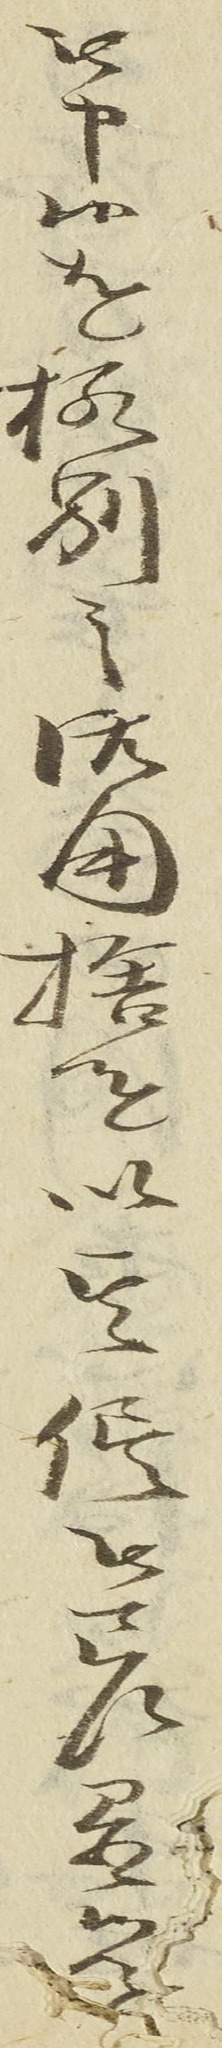被申候を格別之御用捨を以其儘被差置候を
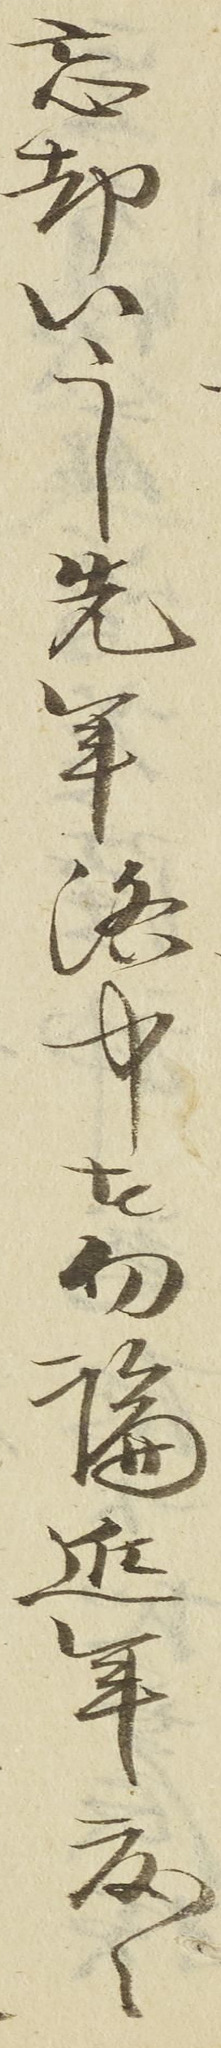忘却いたし先年洛中ハは勿論近年度々
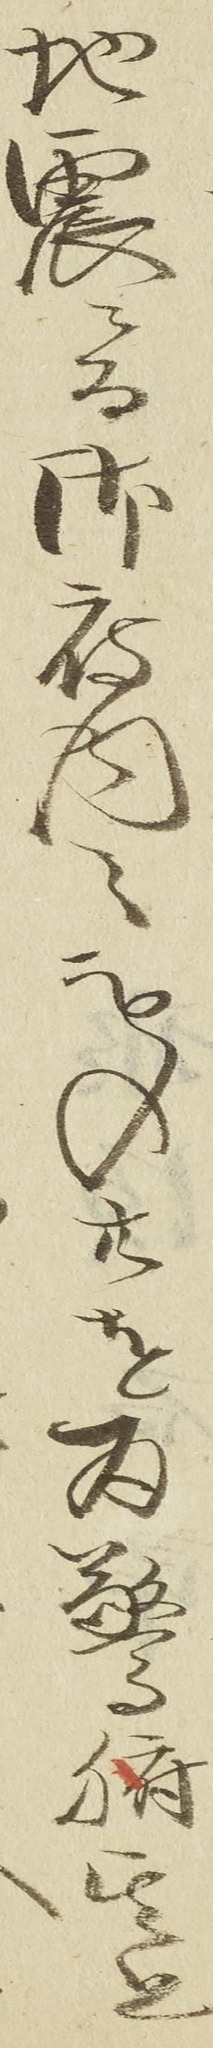地震二而御府内之もの共を為驚怖其上
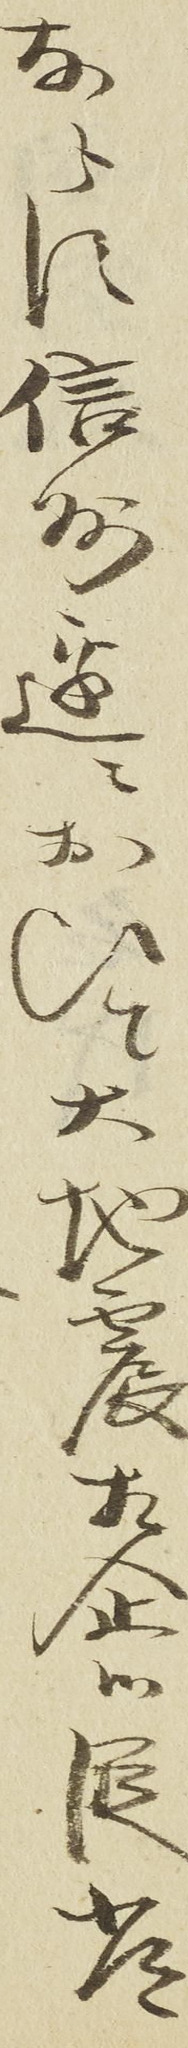ならす信州辺におひて大地震相企候段常
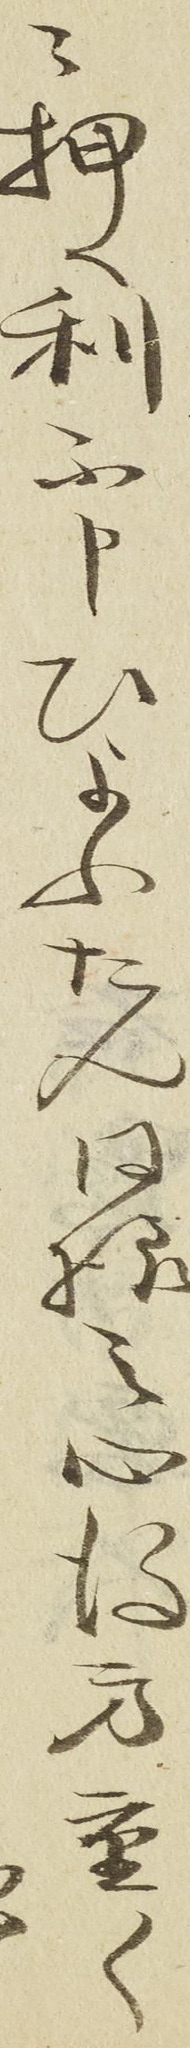々押利不申ひよふたん同様之心得方重々
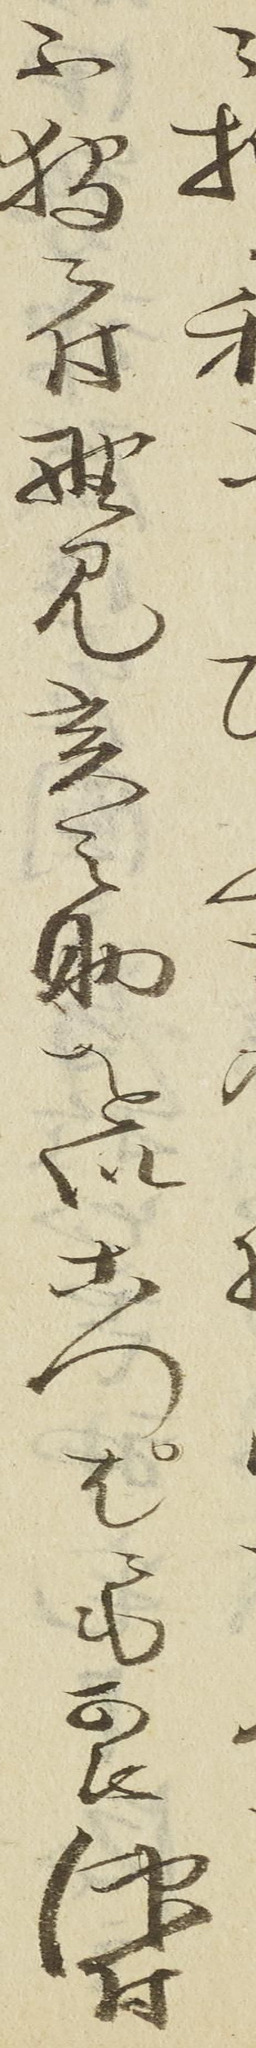不埒二付野見亥之助を以こつば二も可被仰付
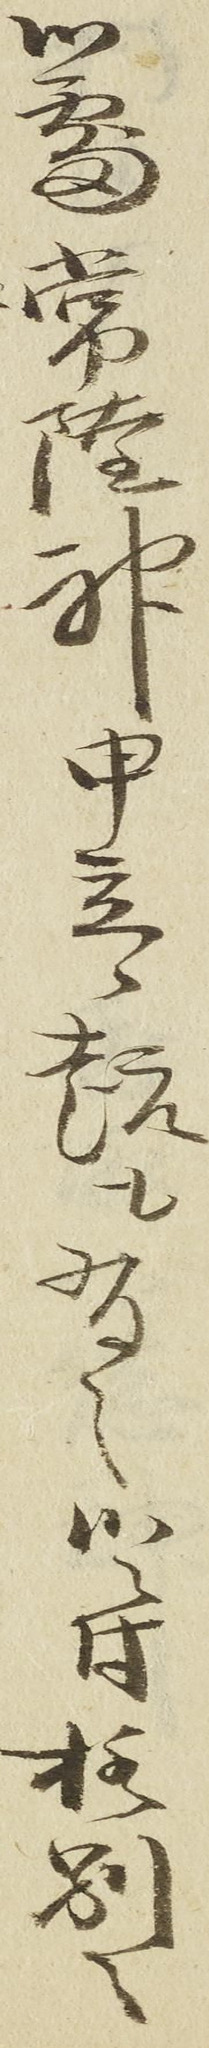候処常陸神申立候趣も有之候二付格別之
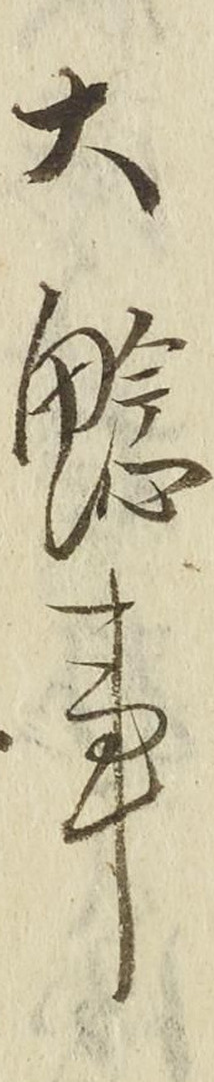大鯰事
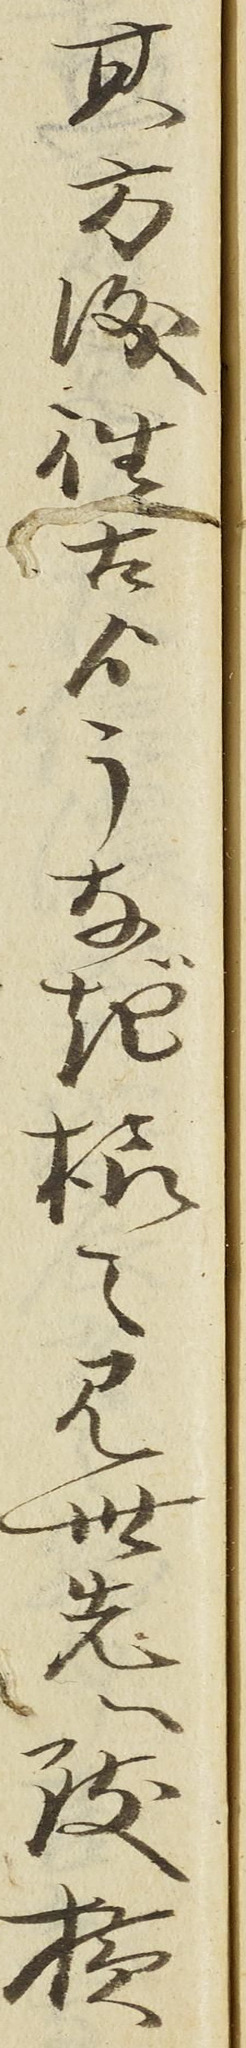其方儀往古ゟうなぎ様之見世先へ致横
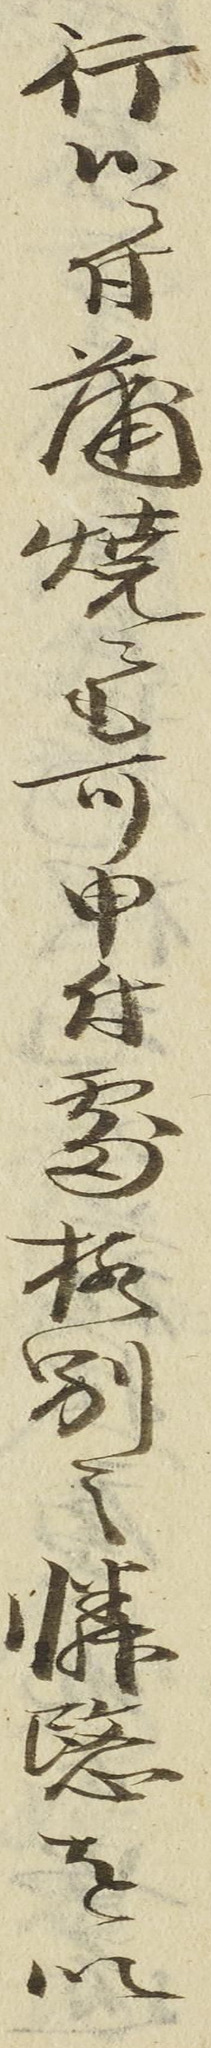行候二付蒲焼二も可申付処格別之憐憫を以
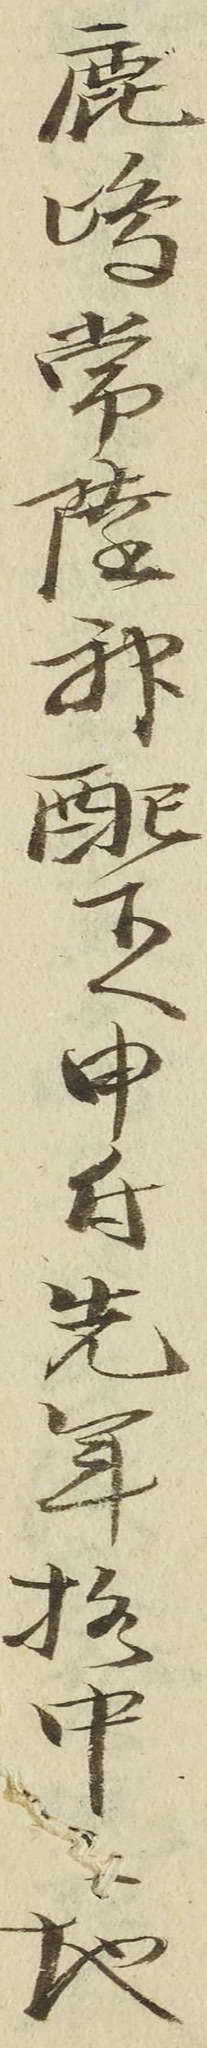廉嶋常陸神配下へ申付先年挌中之地
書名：信濃國大地震記　乾
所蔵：東京大学地震研究所図書室 Earthquake Research Institute Library, The University of Tokyo, JAPAN
